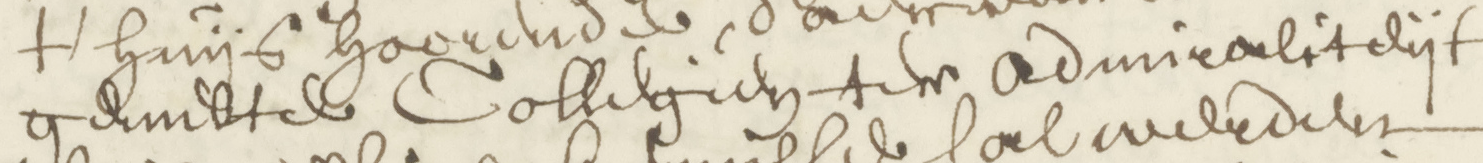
gemelte Collegien ter Admiraliteijt
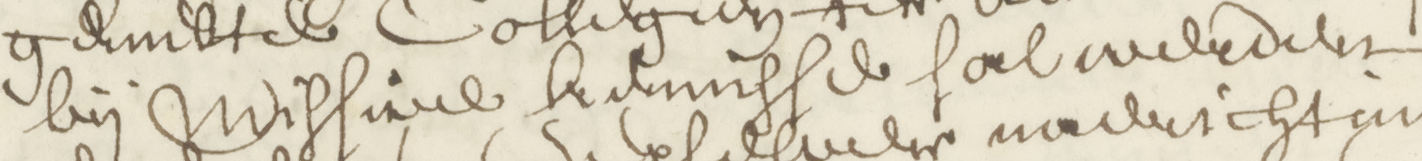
bij Missive kennisse sal werden
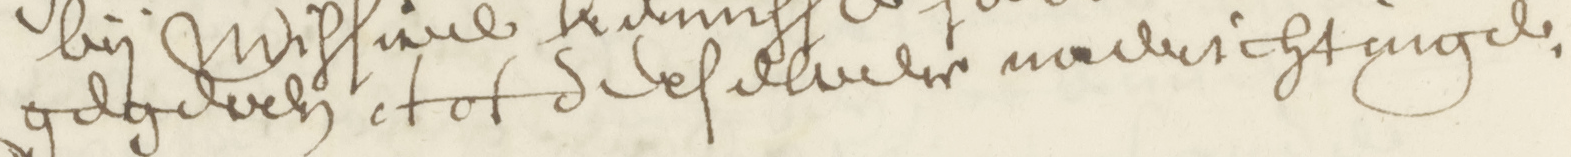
gegeven, tot derselver naerichtinge.
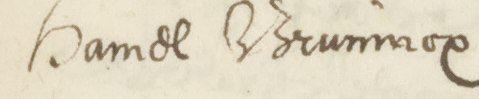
Hamel Brunincx
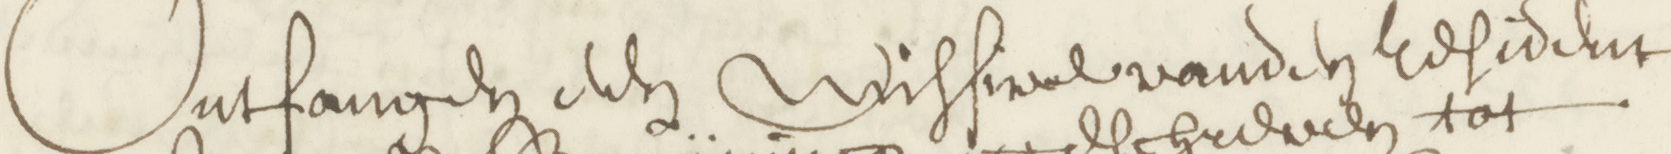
Ontfangen een Missive vanden resident
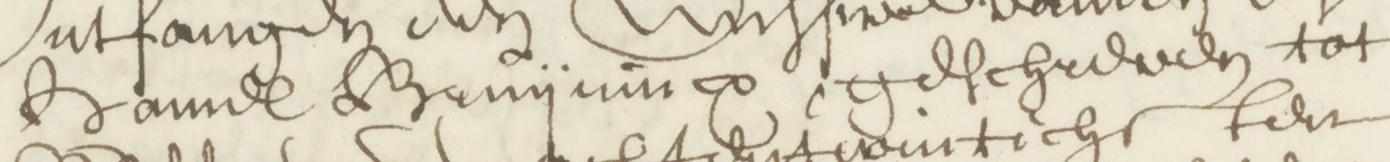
Hamel Bruijnincx, geschreven tot
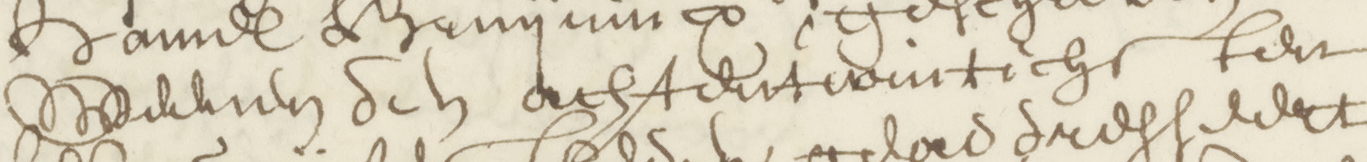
Weenen den achtentwintichsten
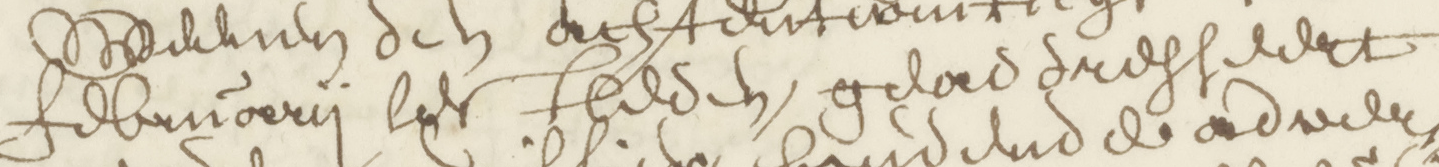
februarij lestheden, geaddresseert
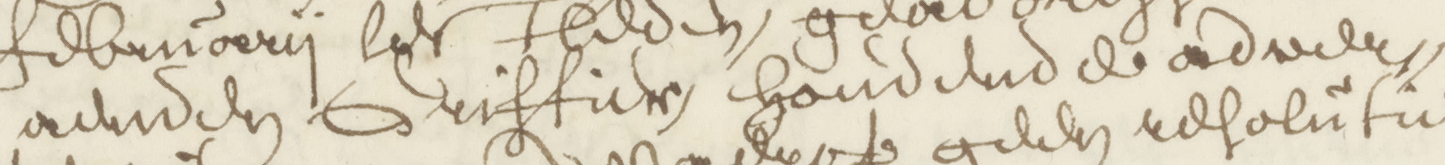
aenden Griffier, houdende adver„
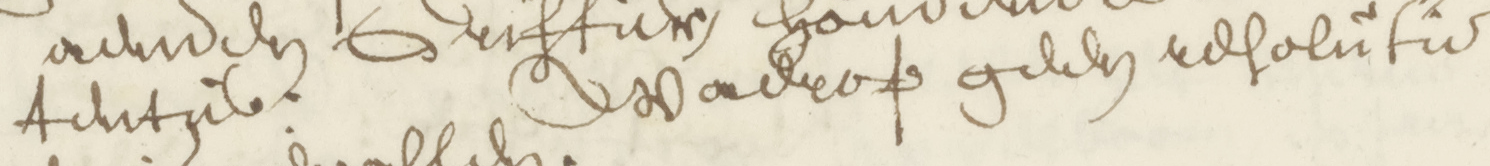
tentie: Waerop geen resolutie
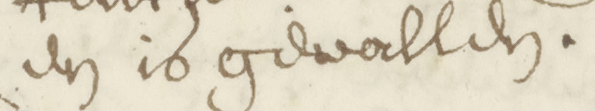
en is gevallen.
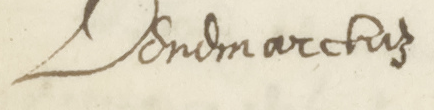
Denemarcken
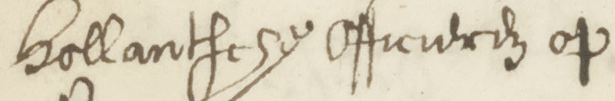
hollantsche officieren op
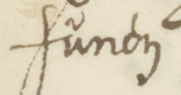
Funen
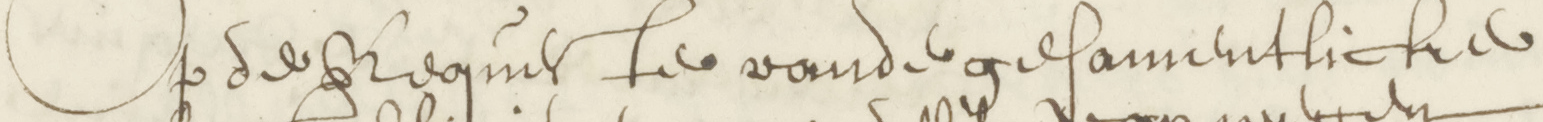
Op de Requeste vande gesamentlicke
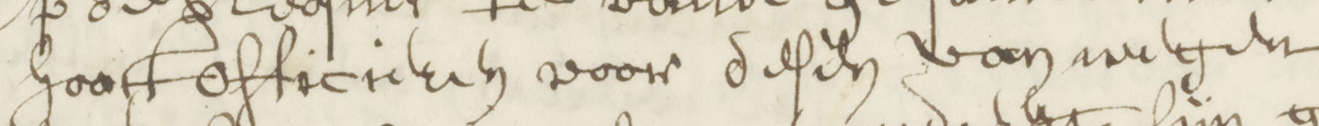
hooftofficieren voor desen van wegen
